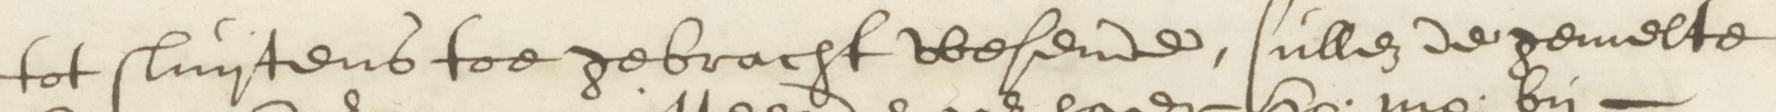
tot sluijtens toe gebracht wesende, sullen de gemelte
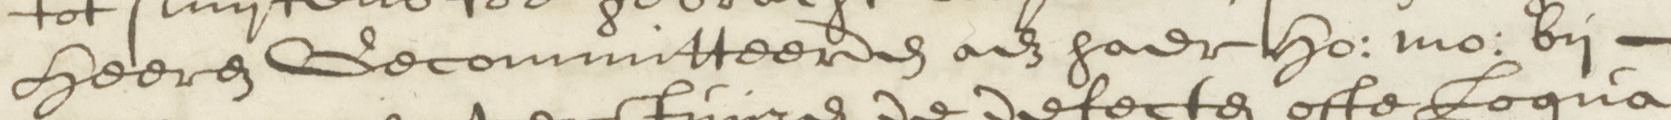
heeren Gecommitteerden aen haer Ho:mo: bij —
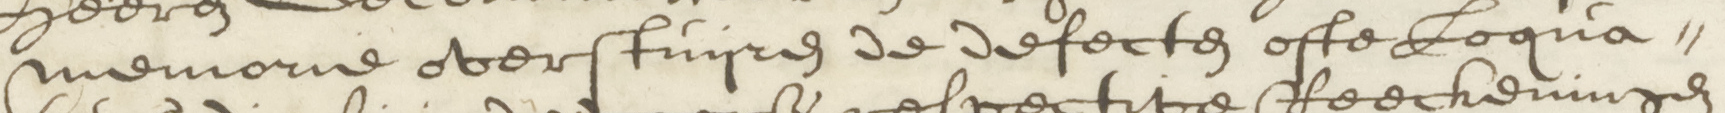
memorie overstuijren de defecten ofte Loqua„
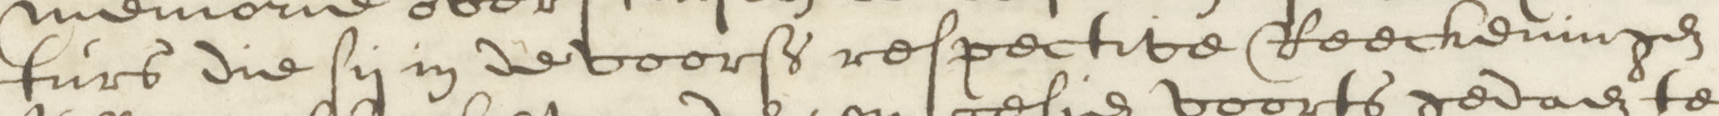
turs die sij in de voors respective Reeckeningen
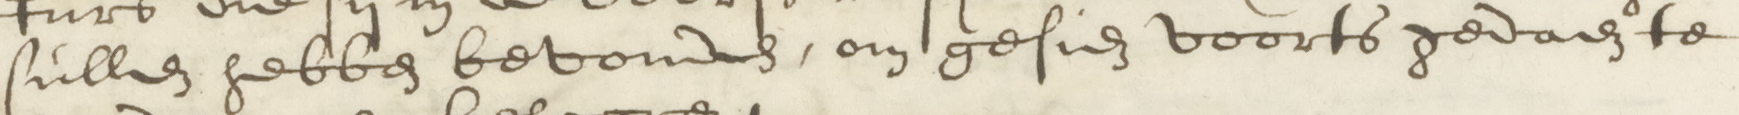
sullen hebben bevonden, om gesien voorts gedaen te
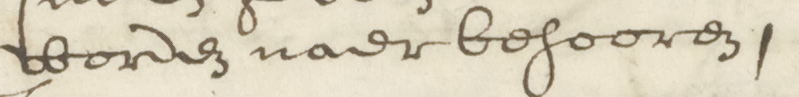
worden naer behooren.
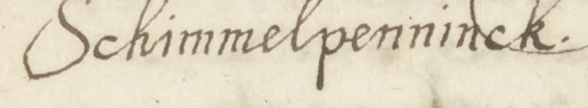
Schimmelpenninck.
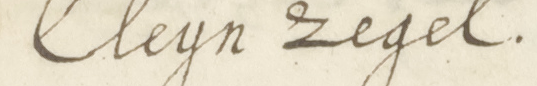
Cleijn zegel.
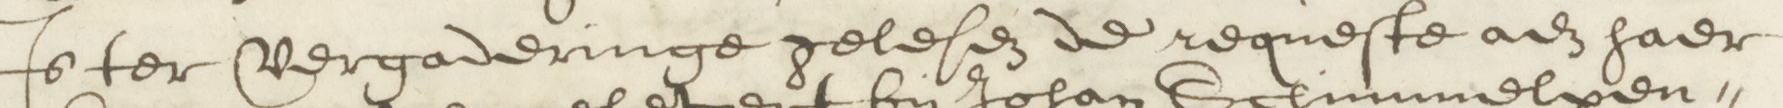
Is ter Vergaderinge gelesen de requeste aen haer
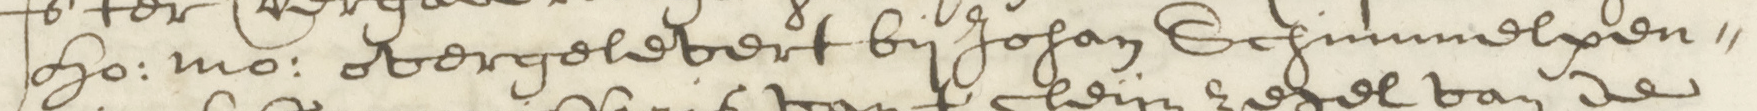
Ho:mo: overgelevert bij Johan Schimmelpen„
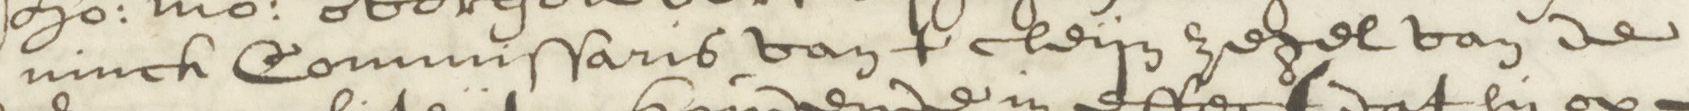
ninck Commissaris van t'cleijn zegel van de
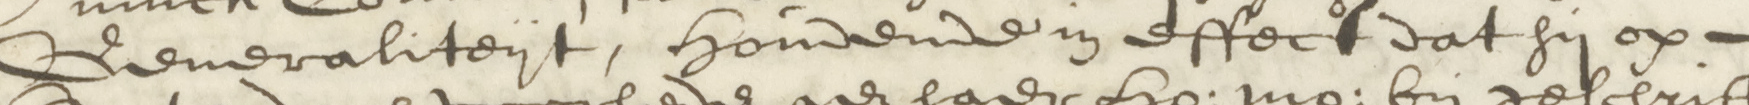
Generaliteijt, houdende in effect dat hij op —
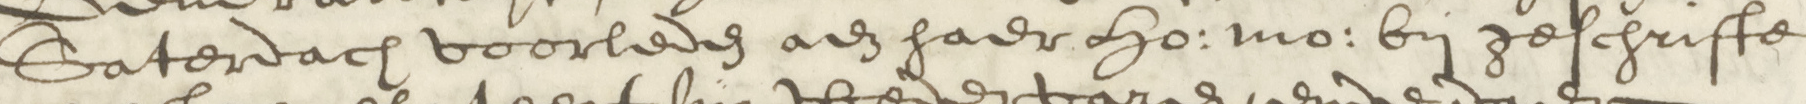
Saterdach voorleden aen haer Ho:Mo: bij geschrifte
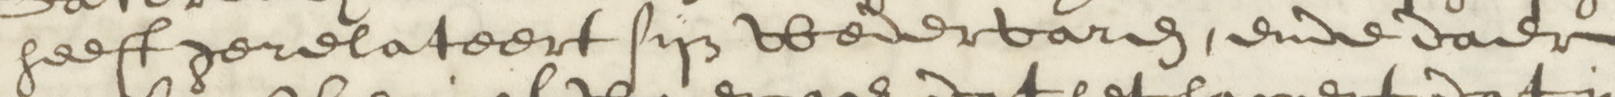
heeft gerelateert sijn wedervaren, ende daer
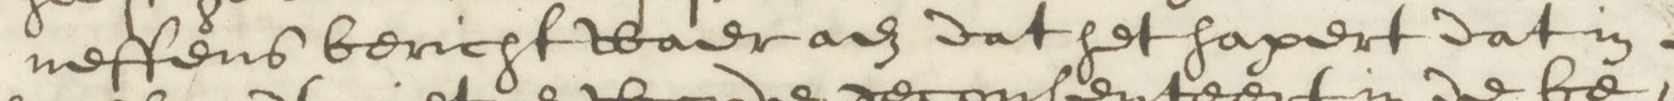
neffens bericht waer aen dat het hapert dat in —
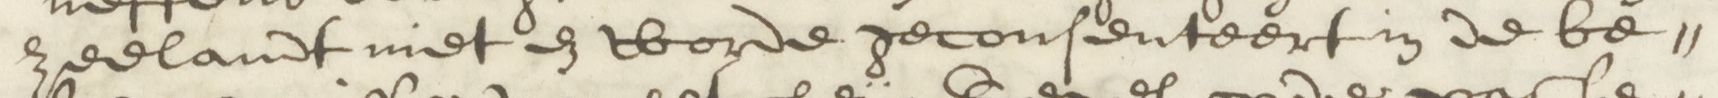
zeelandt niet en worde geconsenteert in de be„
